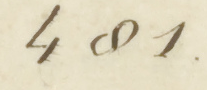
481
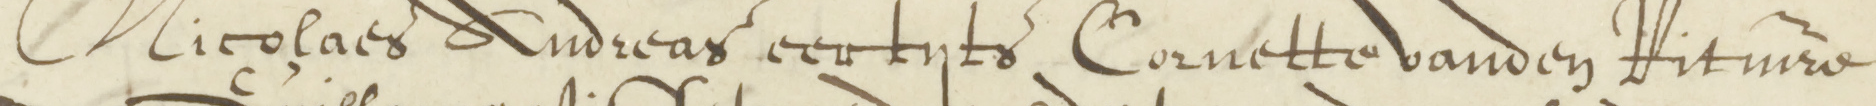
Nicolaes Andreas eertyts Cornette vanden Ritmre
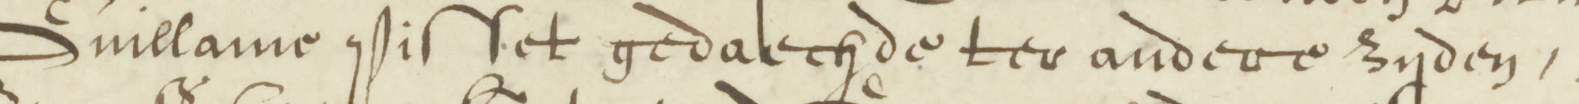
Guillame Pisset gedaechde ter andere zyden
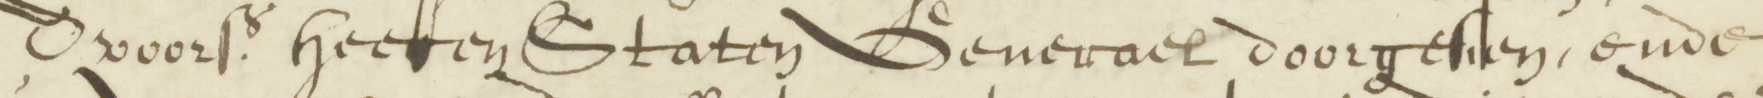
dvoors. heeren Staten Generael doorgesien, ende
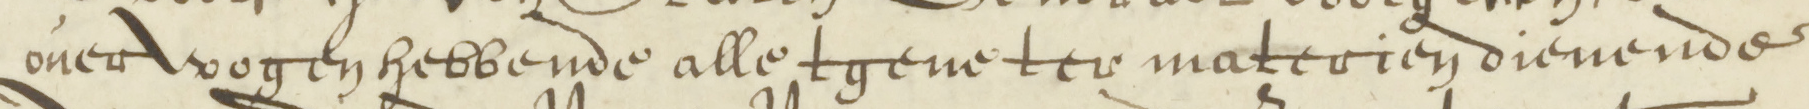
ouerwogen hebbende alle tgene ter materien dienende
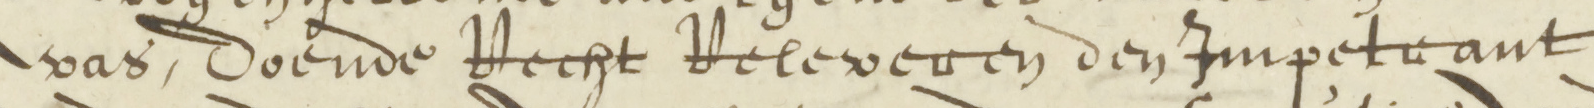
was, doende Recht Releveren den Impetrant
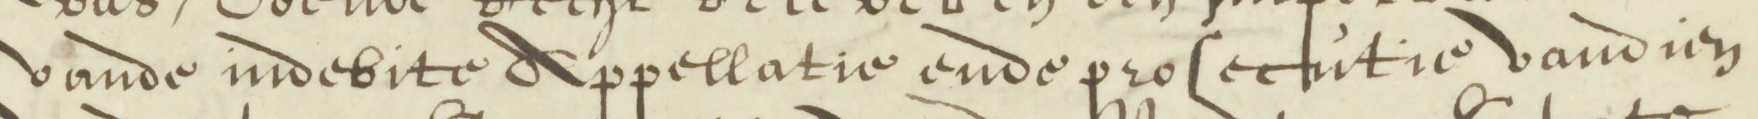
vande indebite Appellatie ende prosecutie vandien
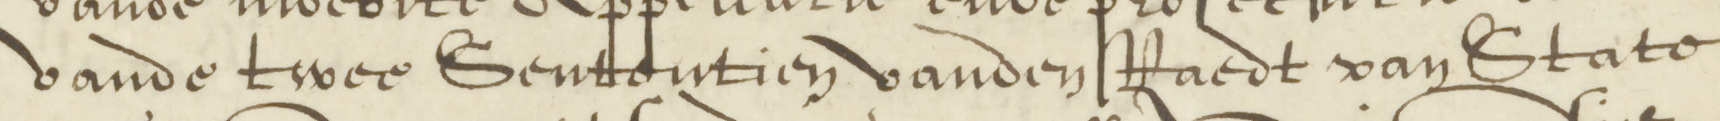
vande twee Sententien vanden Raedt van State
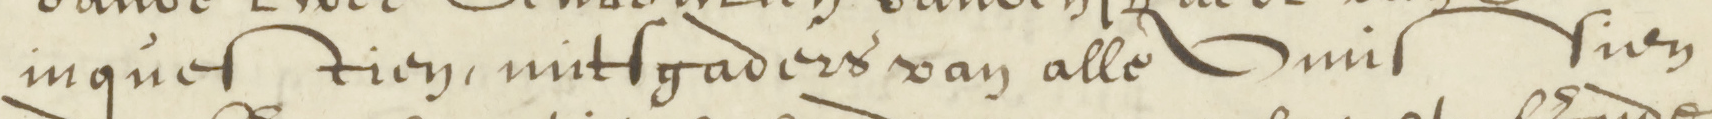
in questien, mitsgaders van alle Omissien
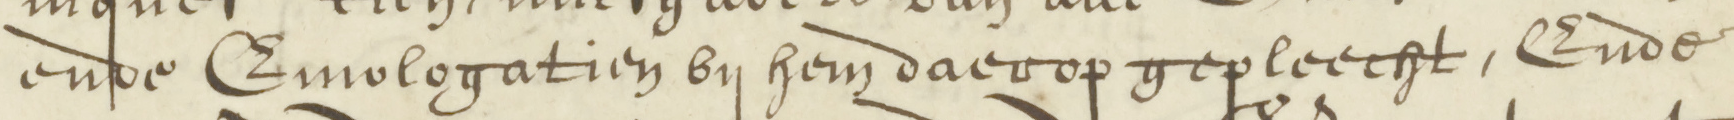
ende Emologatien bij hem daerop gepleecht. Ende
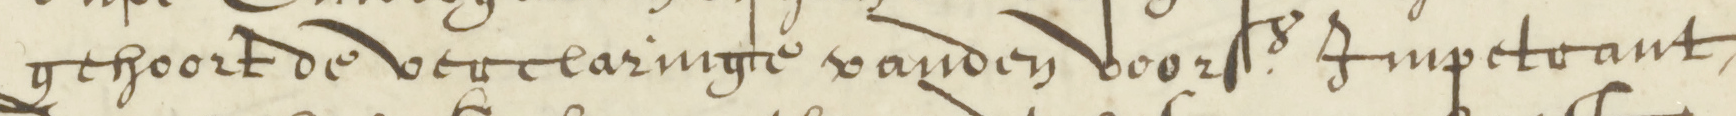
gehoort de verclaringe vanden voors. Impetrant
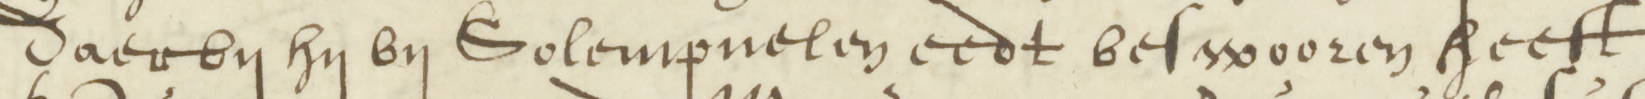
daerby hy by Solempnelen eedt beswooren heeft
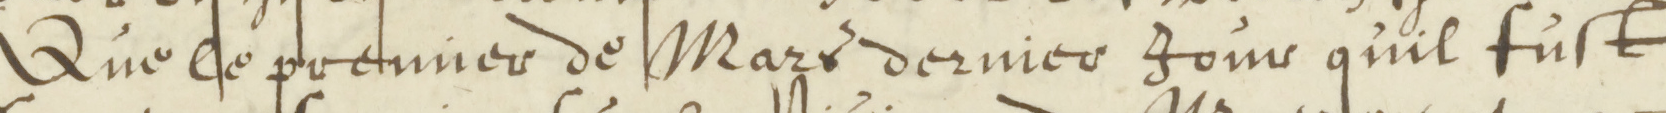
(Que le premier de Mars dernier Jour quil fust
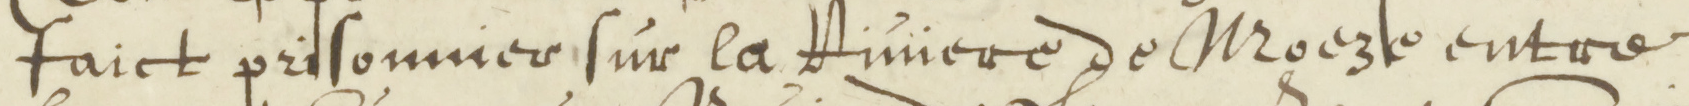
faict prisonnier sur la Riuiere de Moeze entre
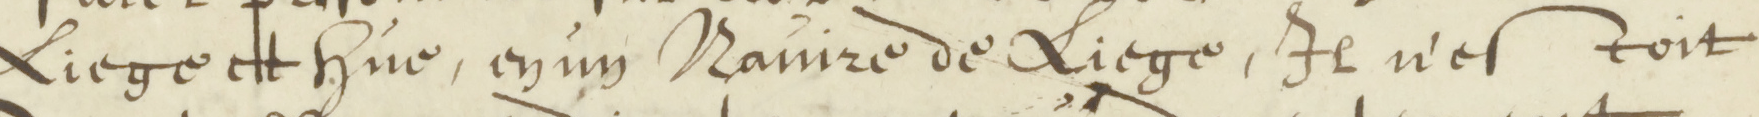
Liege et Hue, en un Nauire de Liege, Il n'estoit
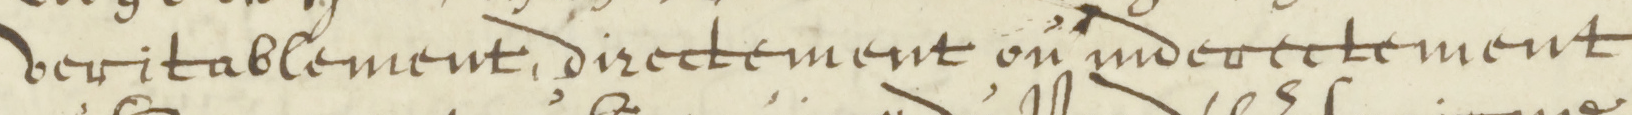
veritablement, directement ou inderectement
